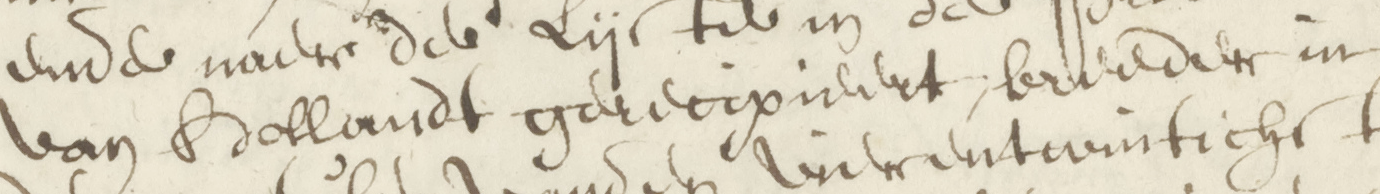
van Hollandt gerecipieert, breeder in
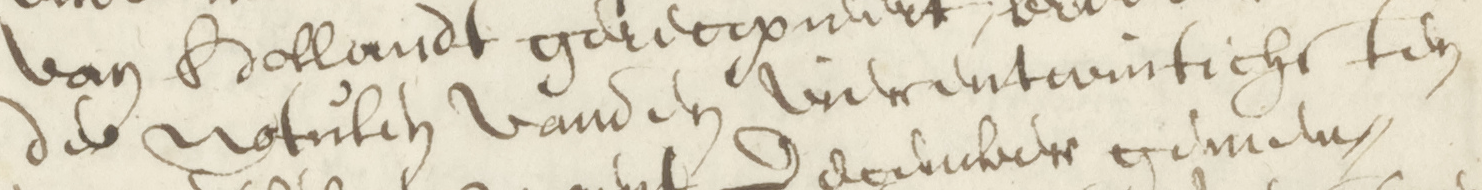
de Notulen vanden vierentwintichsten
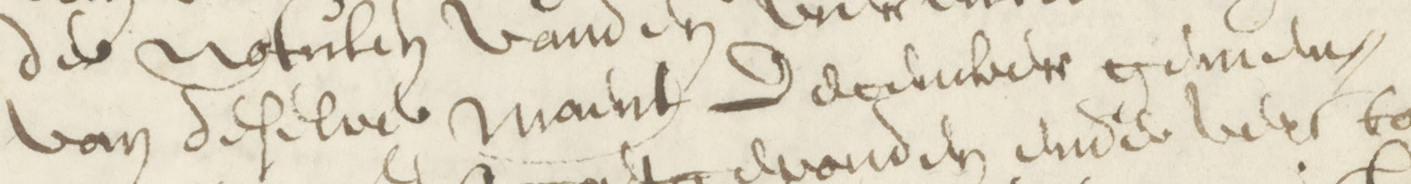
van deselve maent December gemen„
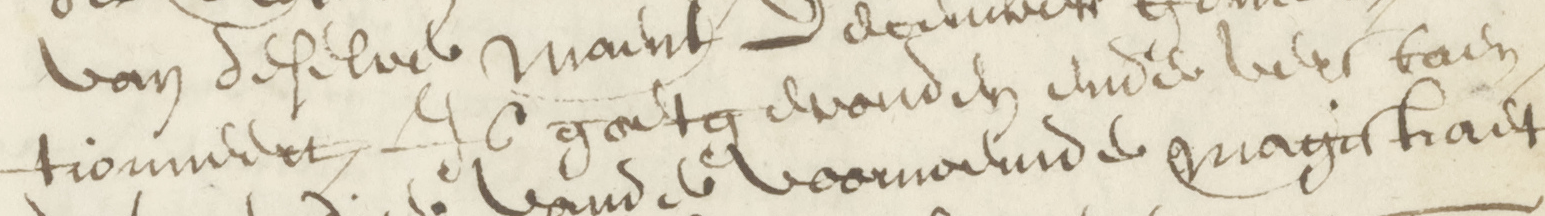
tionneert, Is goetgevonden ende verstaen
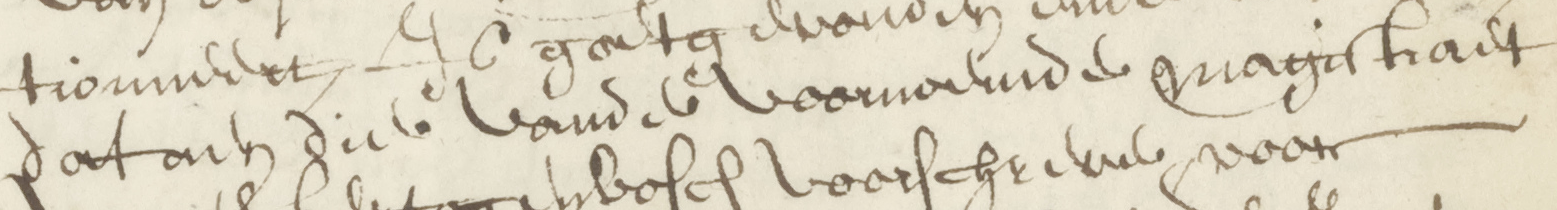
dat aen die vande voornoemde magistraet
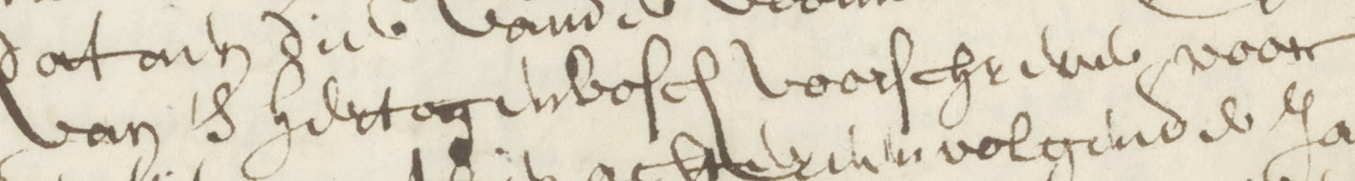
van ‛s hertogenbosch voorschreve, voor
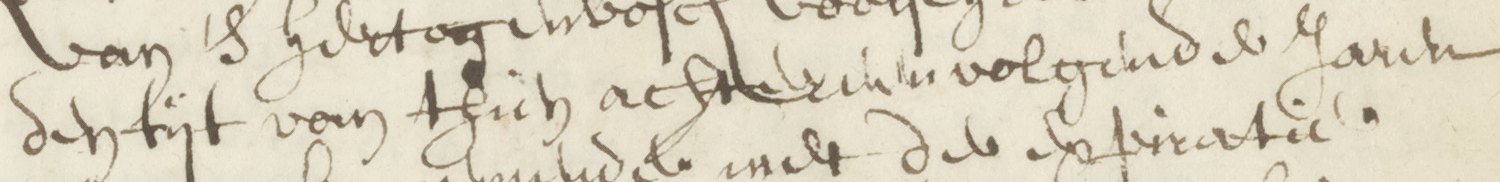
den tijt van thien achtereenvolgende Jaren
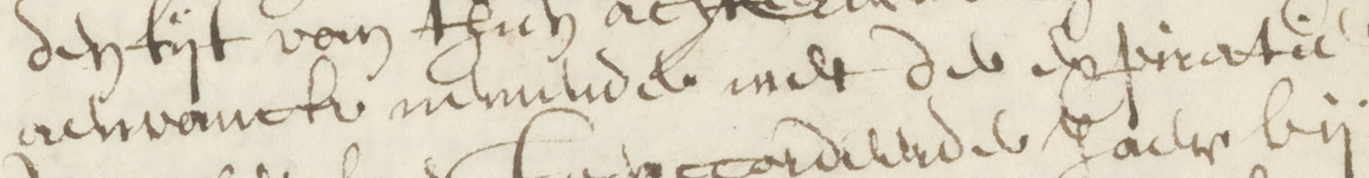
aenvanck nemende met de expiratie
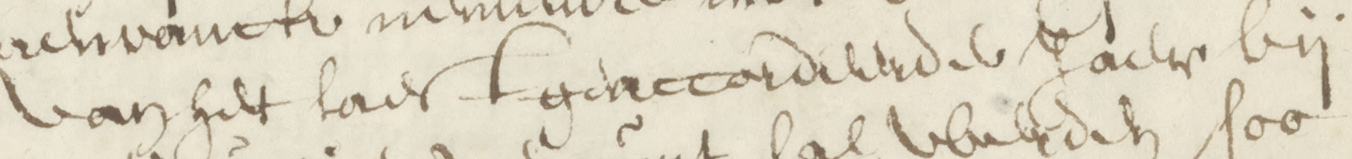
van het laest geaccordeerde Jaer bij
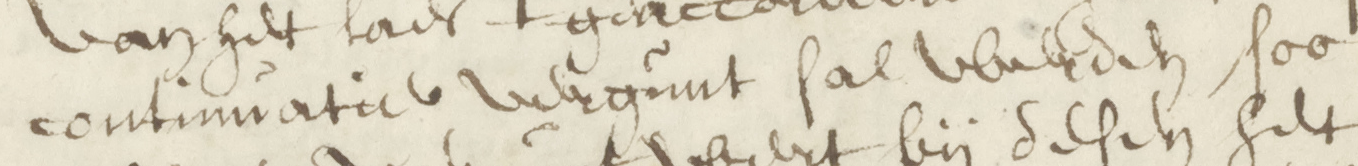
continuatie vergunt sal werden, soo
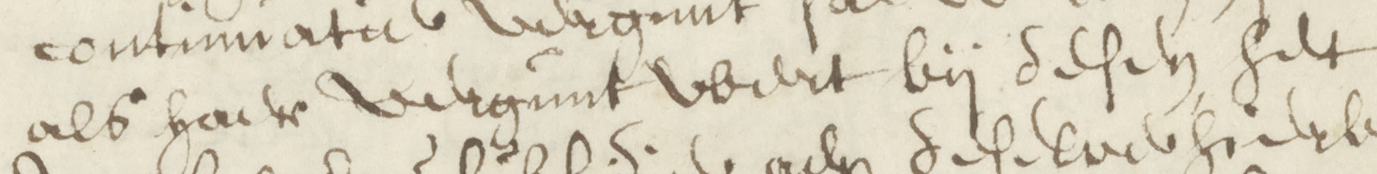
als haer vergunt wert bij desen het
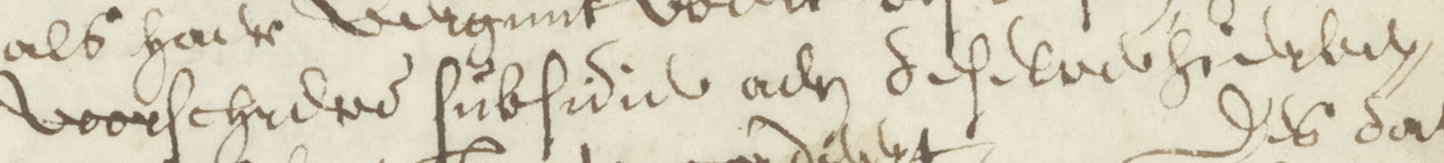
voorschreve subsidie aen deselve hierbe„
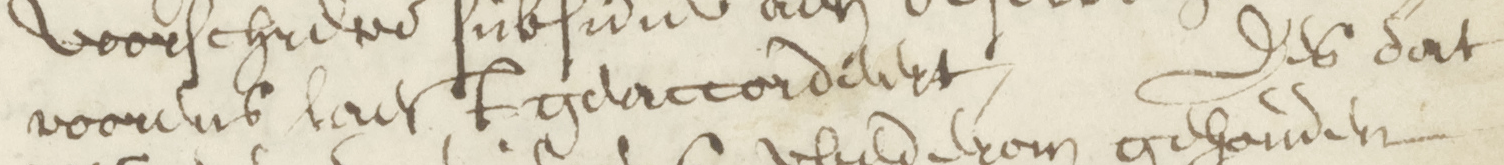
voorens haest geaccordeert. Des dat
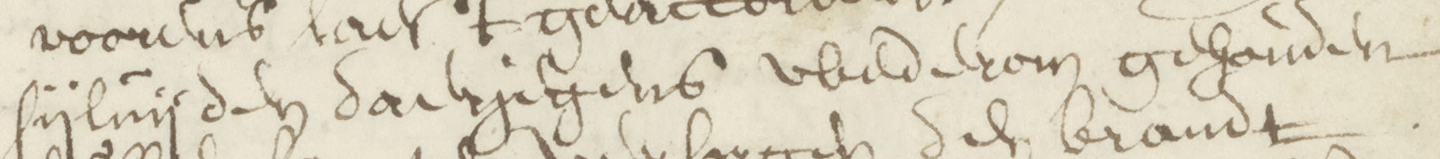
sijluijden daerjegens wederom gehouden
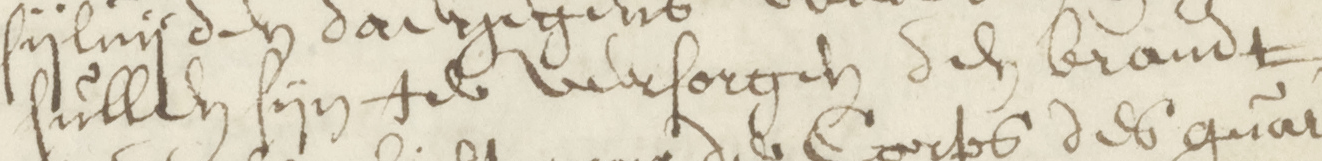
sullen sijn te versorgen den brandt
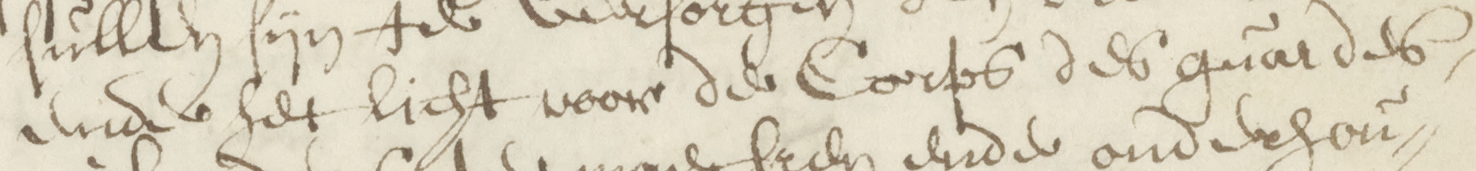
ende het licht voor de Corps des guardes,
